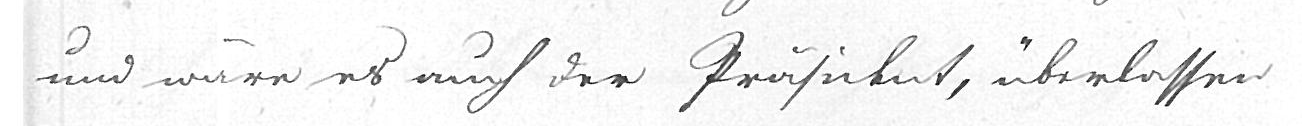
und wäre es auch der Präsident, überlassen
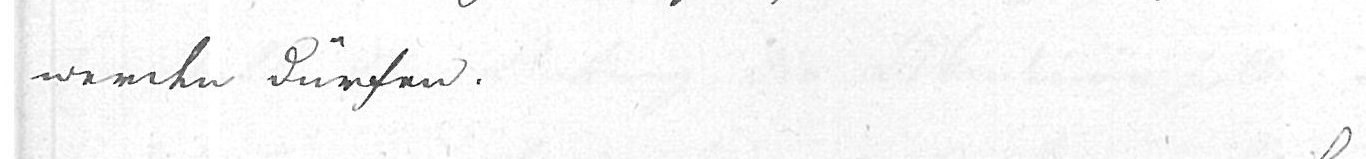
werden dürfen.
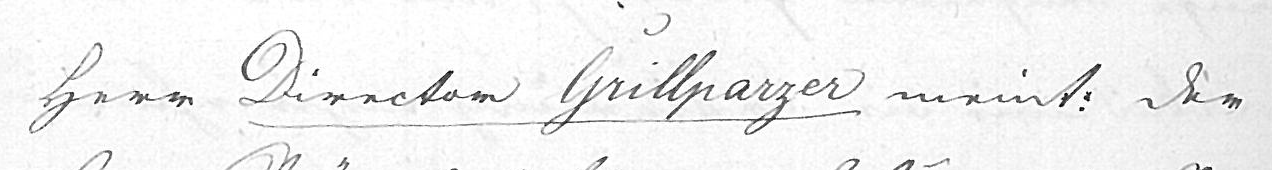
Herr Director Grillparzer meint: der
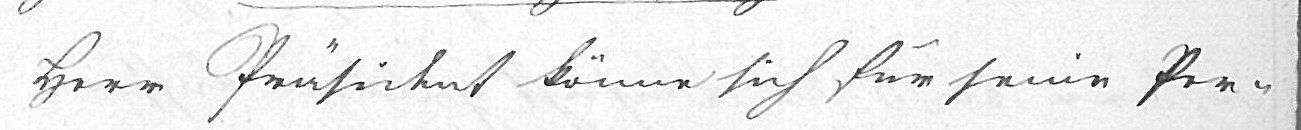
Herr Präsident könne sich für seine Per-
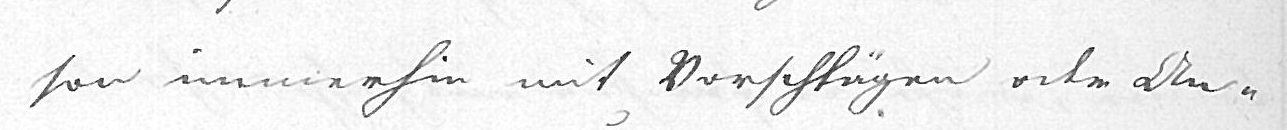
son immerhin mit Vorschlägen oder An-
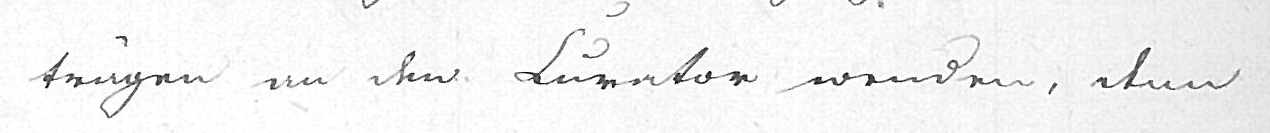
trägen an den Curator wenden, denn
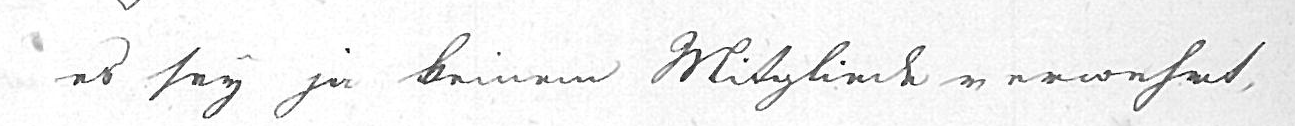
es sey ja keinem Mitglied verwehrt,
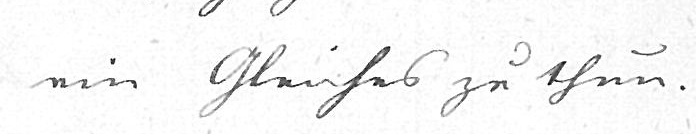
ein Gleiches zu thun.
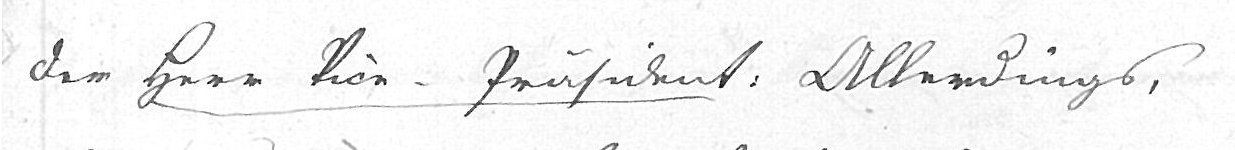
Der Herr Vice-Präsident: Allerdings,
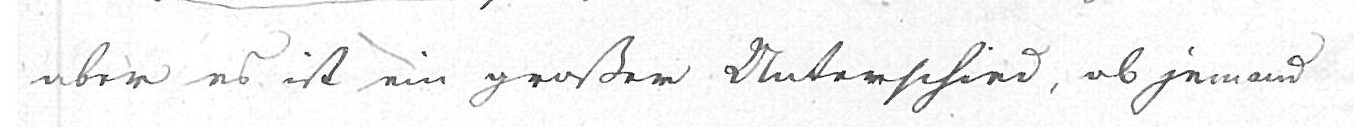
aber es ist ein großer Unterschied, ob jemand
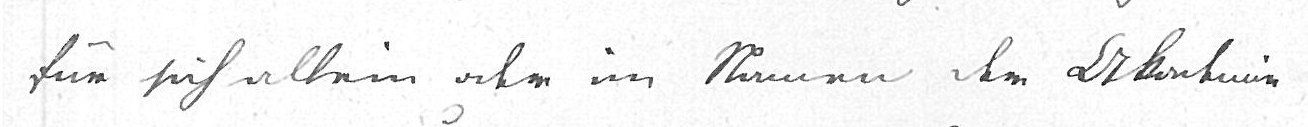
für sich allein oder im Namen der Akademie
